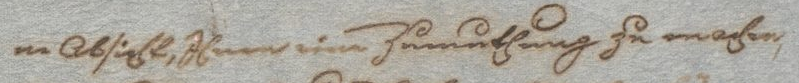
ne Absicht, Ihnen eine Zumuthung zu machen,
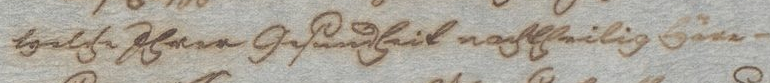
welche Ihrer Gesundheit nachtheilig wäre –
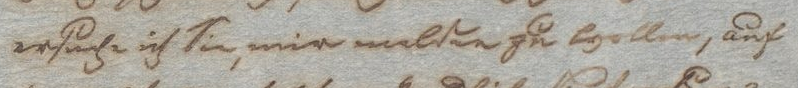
ersuche ich Sie, mir melden zu wollen, auf
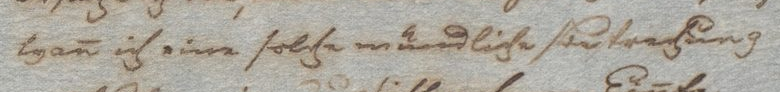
wann ich eine solche mündliche Besprechung
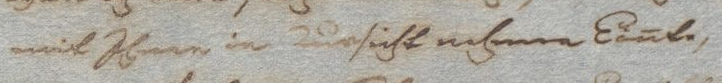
mit Ihnen in Aussicht nehmen könnte,
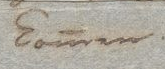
kommen.
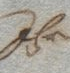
Escher
